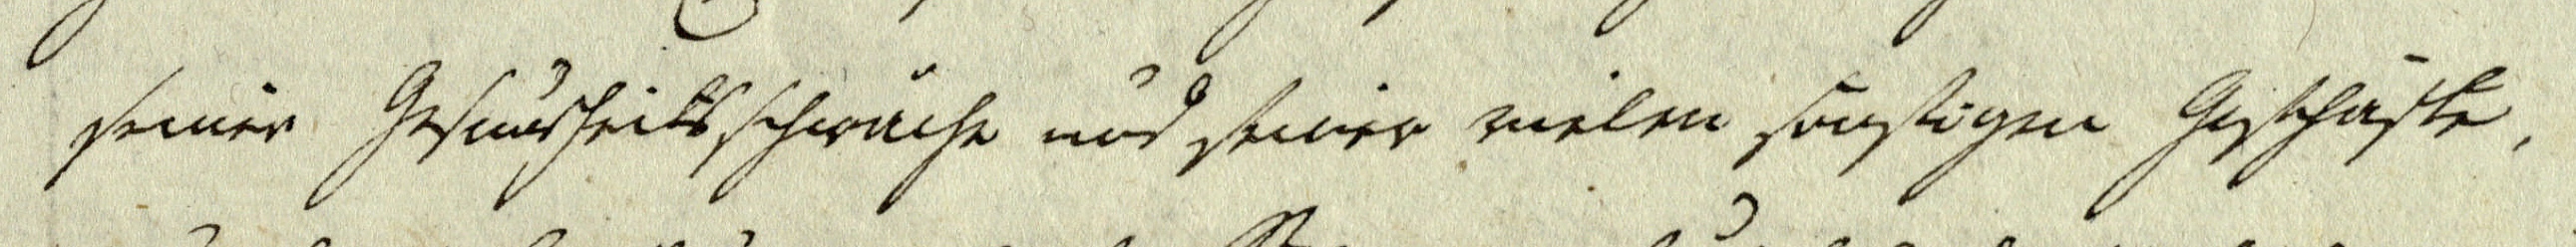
seiner Gesundheitsschwäche und seiner vielen sonstigen Geschäfte,
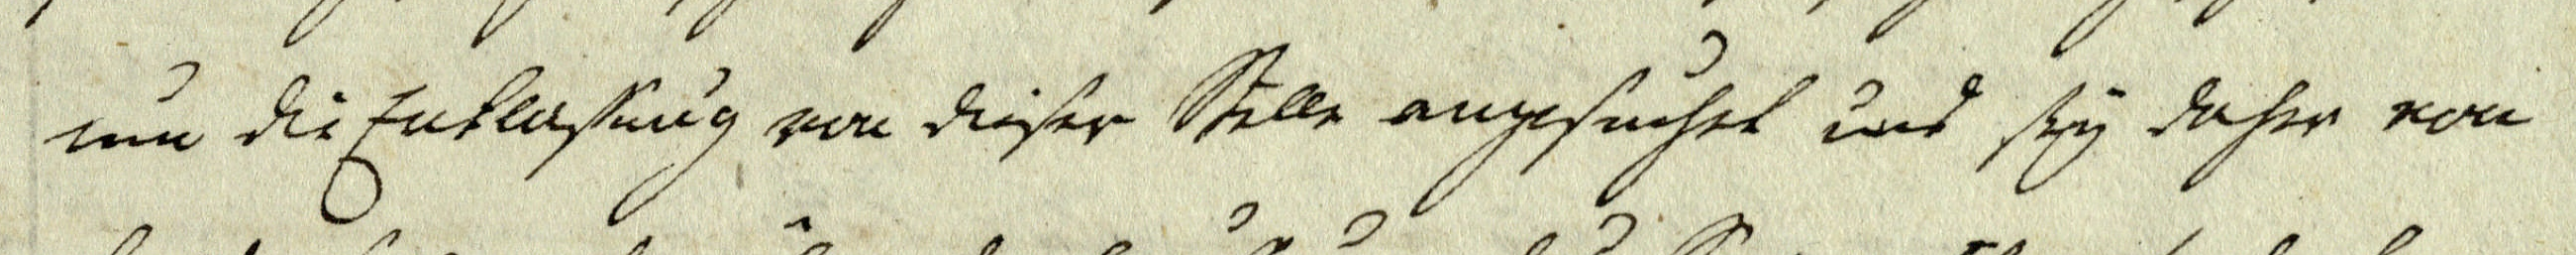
um die Entlassung von dieser Stelle angesuchet und seÿ daher von
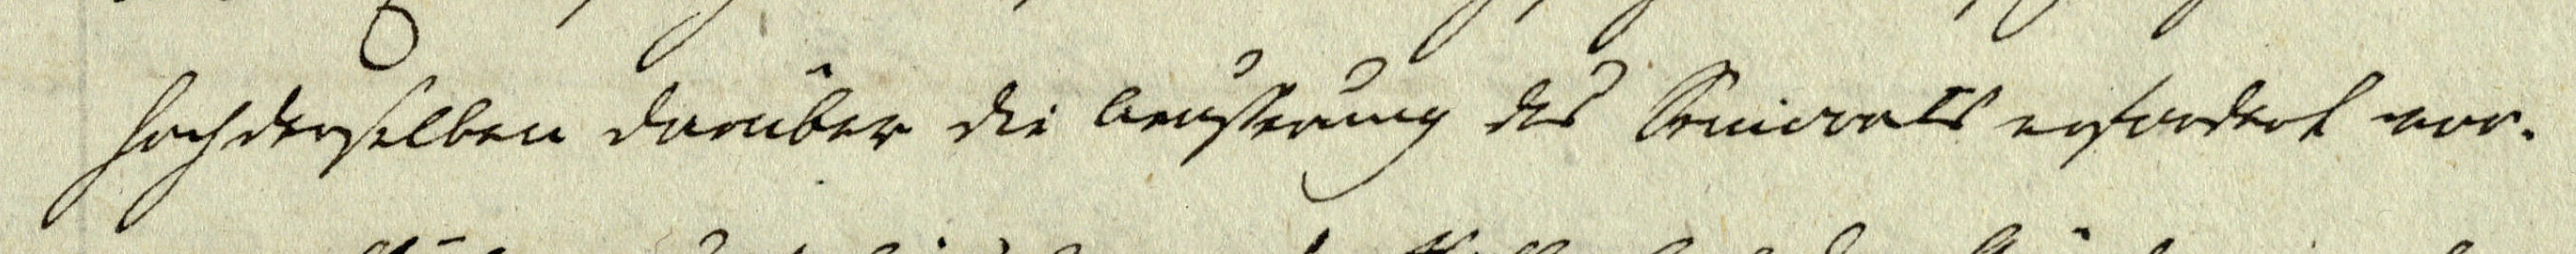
hoch derselben darüber die Aeusserung des Seniorats erfordert wor¬
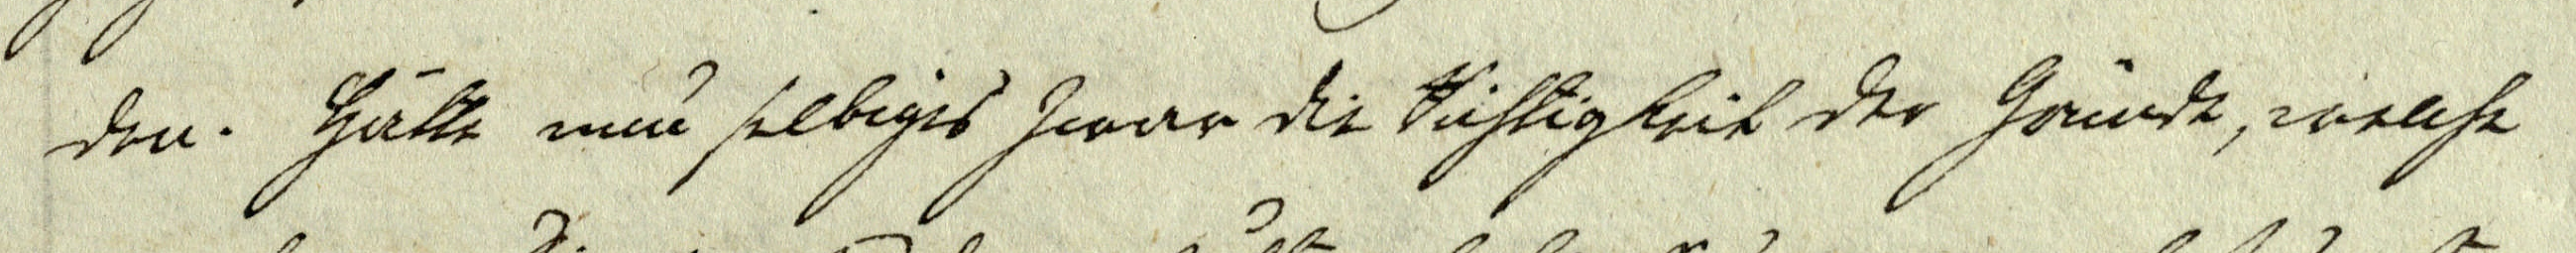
den. Hätte nun selbiges zwar die Richtigkeit der Gründe, welche
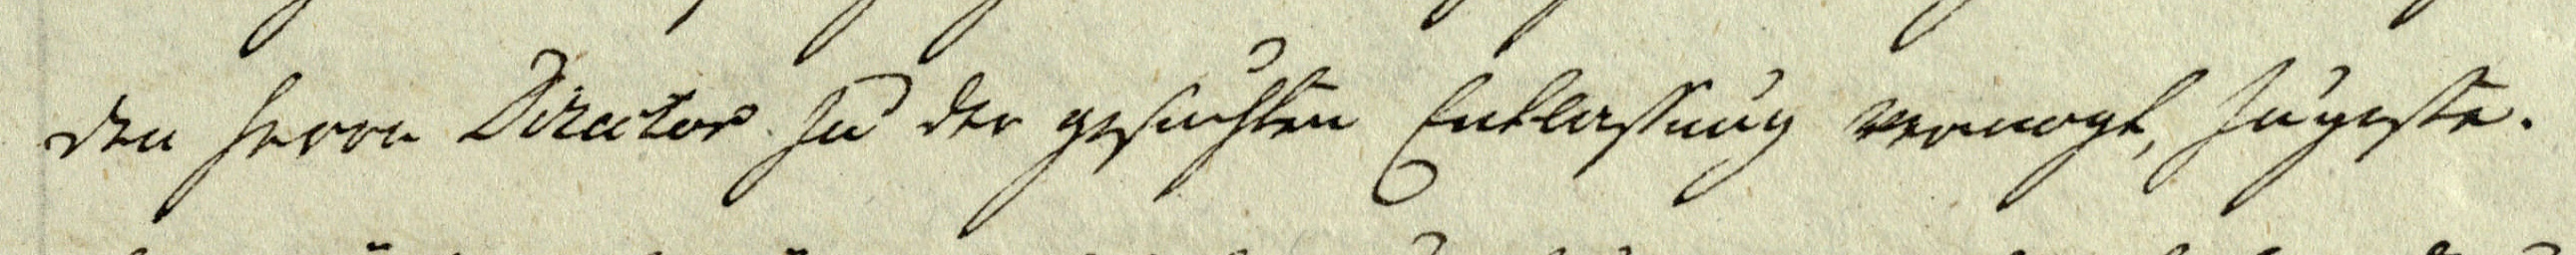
den Herrn Director zu der gesuchten Entlassung vermogt, zugeste¬
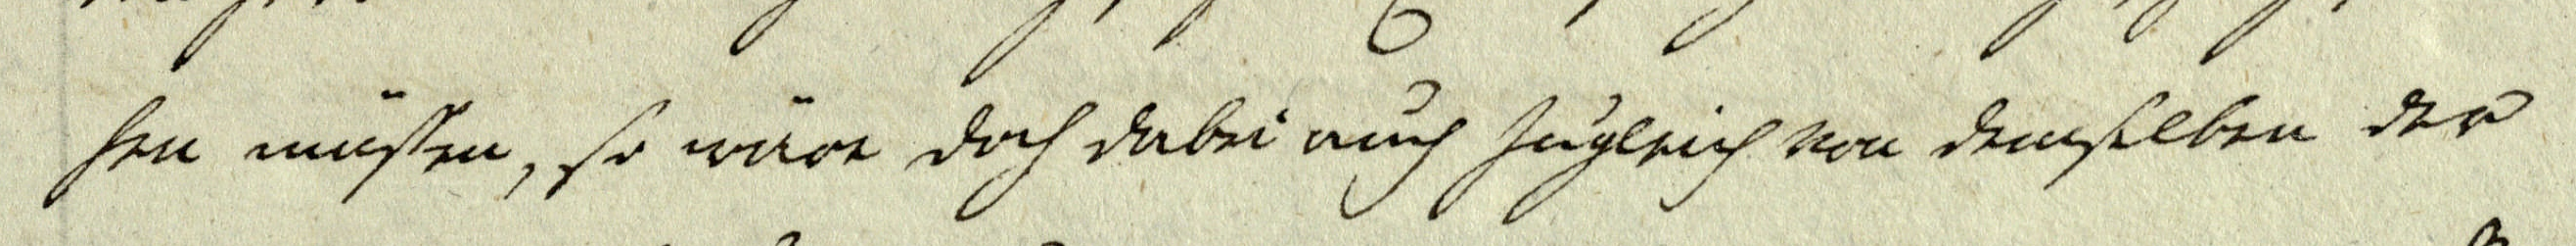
hen müssen, so wäre doch dabei auch zugleich von demselben der
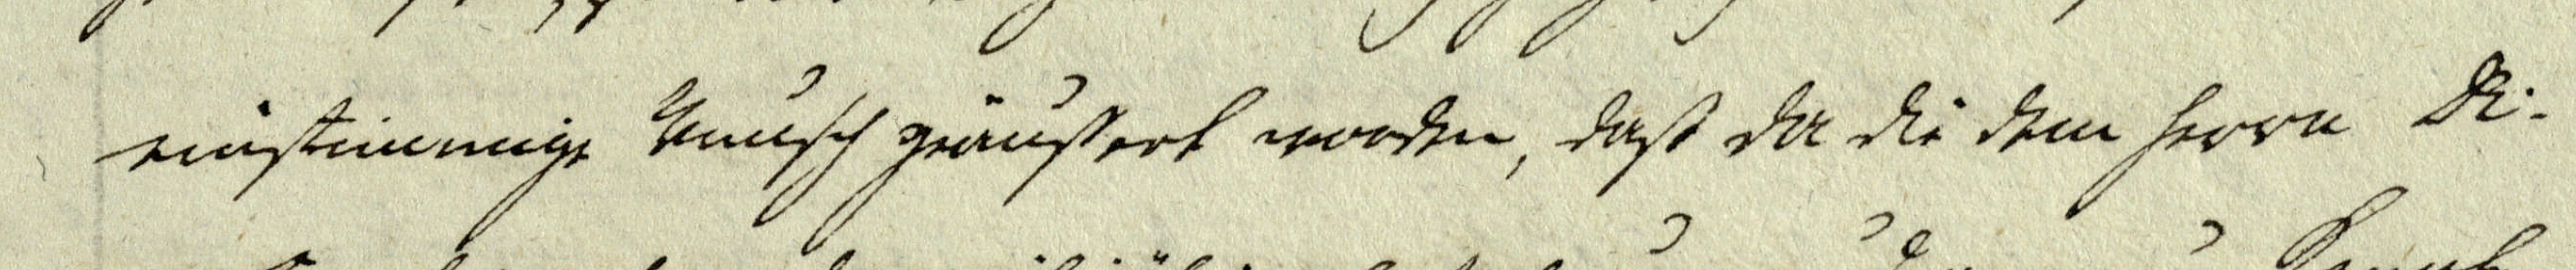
einstimmige Wunsch geäussert worden, daß da die dem Herrn Di¬
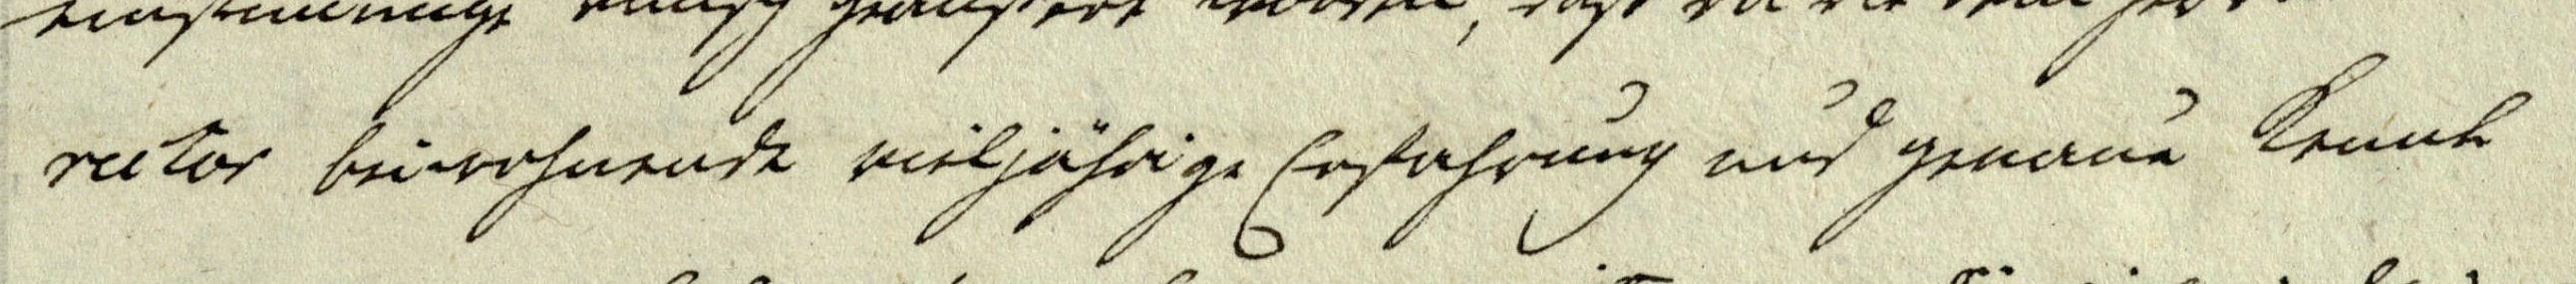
rector beiwohnende vieljährige Erfahrung und genaue Kennt
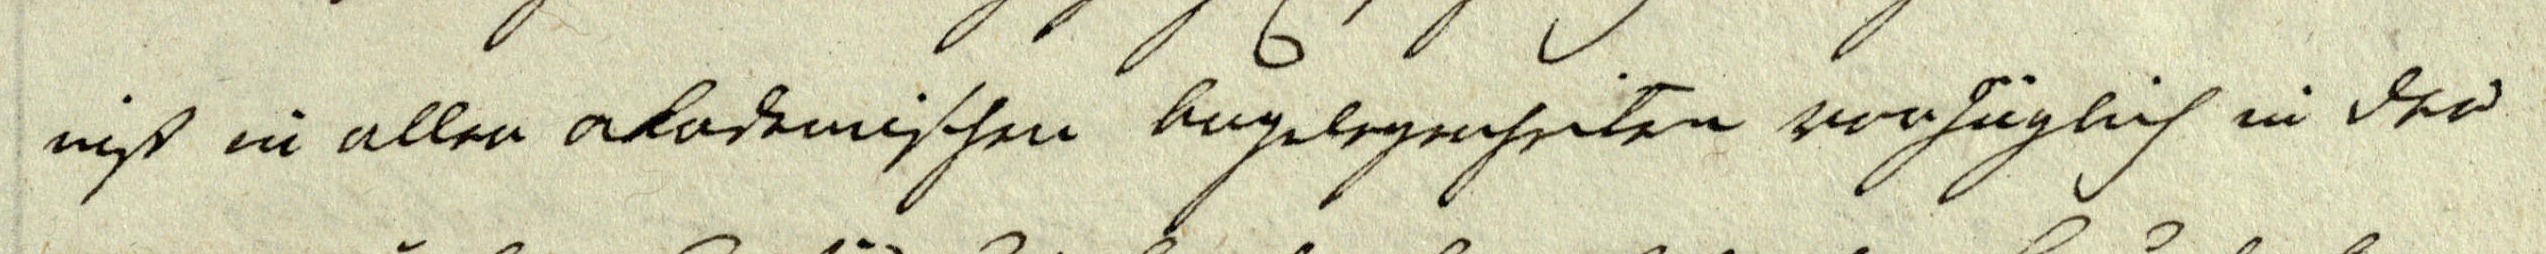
niß in allen akademischen Angelegenheiten vorzüglich in der
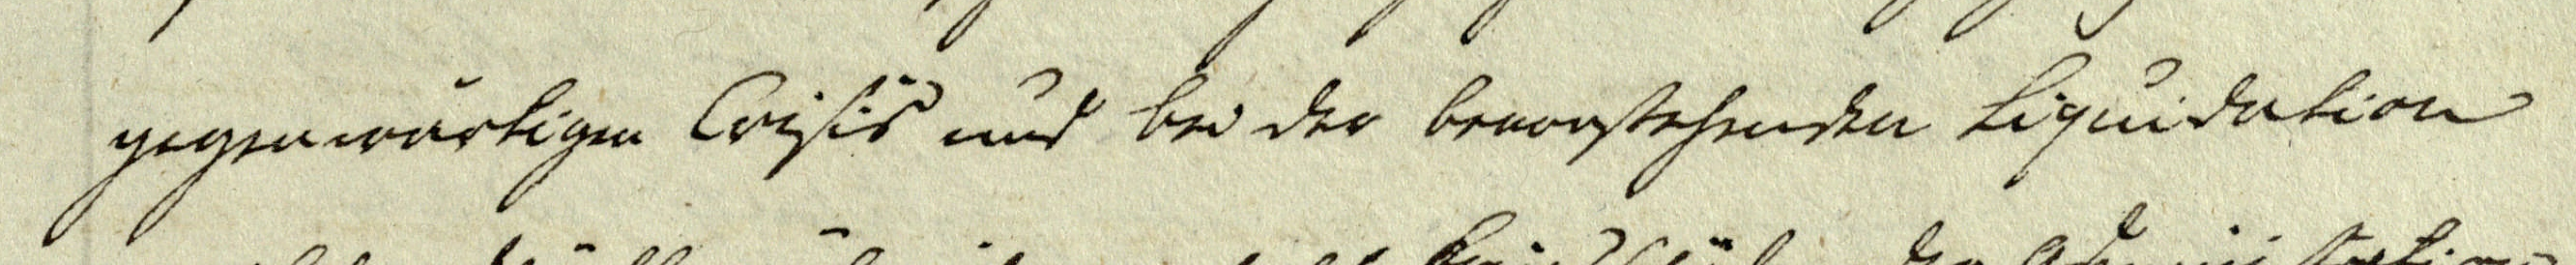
gegenwärtigen Crisis und bei der bevorstehenden Liquidation
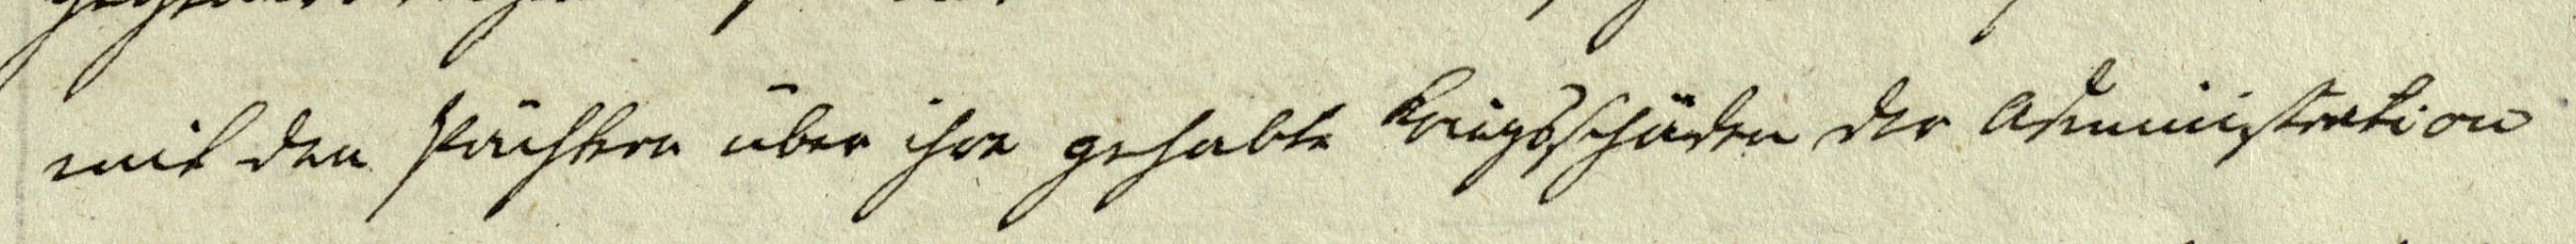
mit den Pächtern über ihre gehabte Kriegschäden der Administration
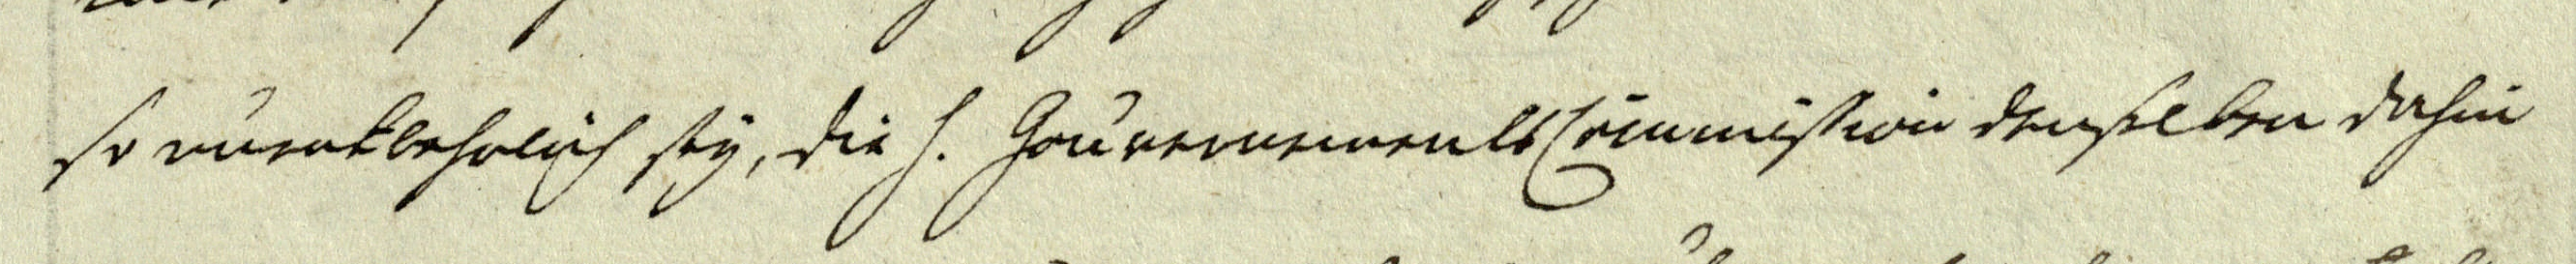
so unentbehrlich seÿ, die h. GouvernementsCommission denselben dahin
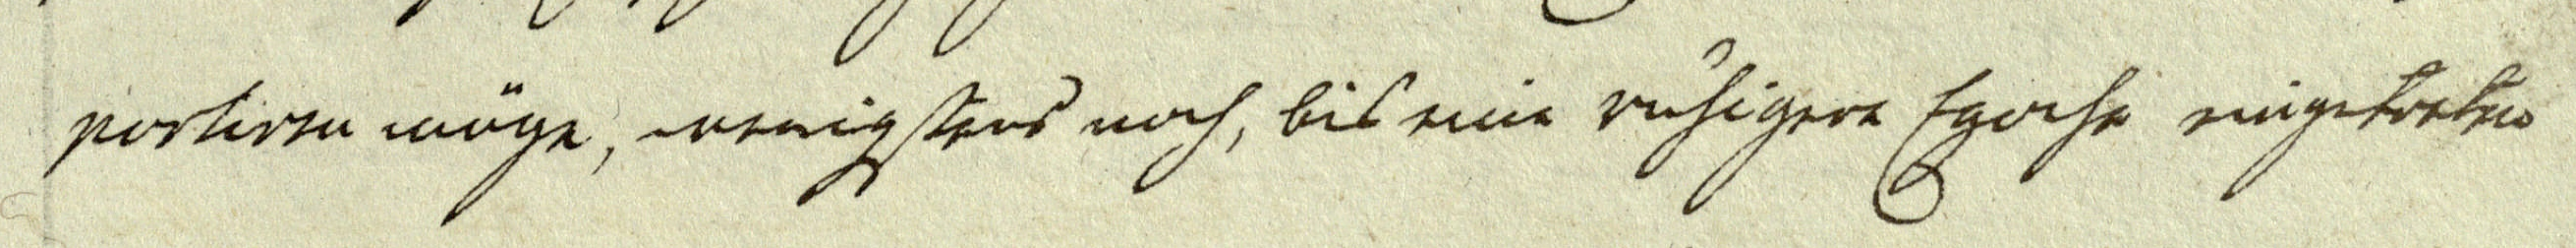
portiren möge, wenigstens noch, bis eine ruhigere Epoche eingetreten
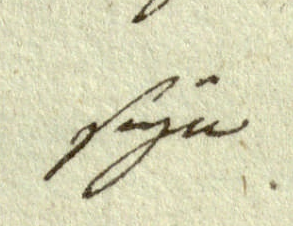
seÿn
